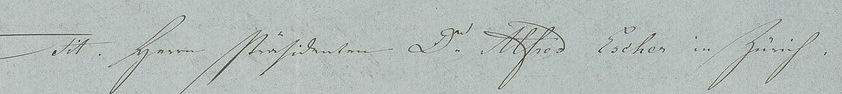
Tit. Herrn Präsidenten Dr Alfred Escher in Zürich.
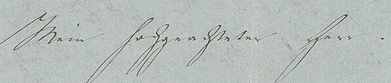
Mein hochgeachteter Herr!
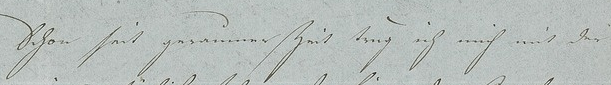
Schon seit geraumer Zeit trug ich mich mit der
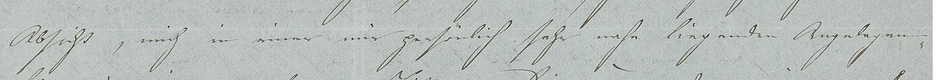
Absicht, mich in einer mir persönlich sehr nahe liegenden Angelegen-
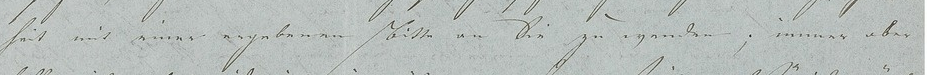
heit mit einer ergebenen Bitte an Sie zu wenden; immer aber
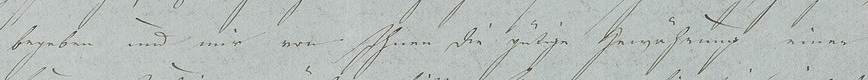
begeben und mir von Ihnen die gütige Gewährung einer
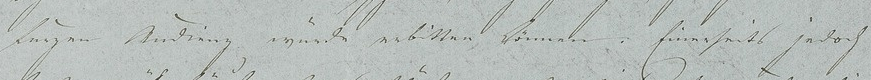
kurzen Audienz würde erbitten können. Einerseits jedoch
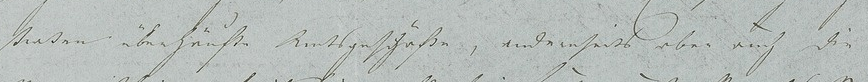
traten überhäufte Amtsgeschäfte, andernseits aber auch die
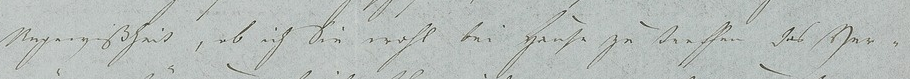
Ungewißheit, ob ich Sie wohl bei Hause zu treffen das Ver-
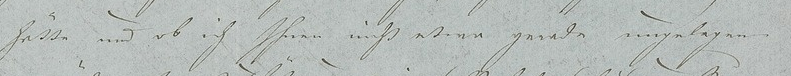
hätte und ob ich Ihnen nicht etwa gerade ungelegen
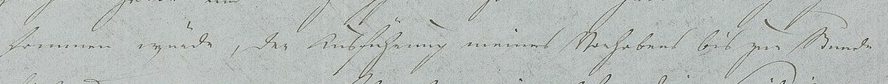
kommen würde, der Ausführung meines Vorhabens bis zur Stunde
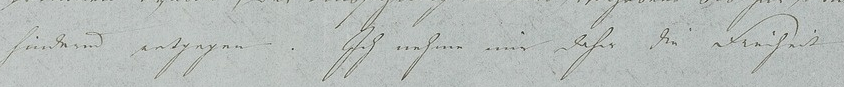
hindernd entgegen. Ich nehme mir daher die Freiheit,
